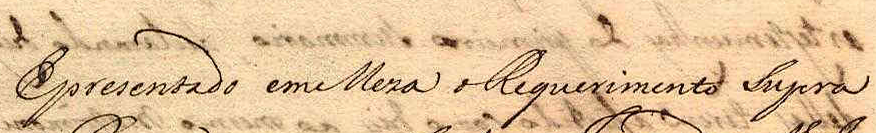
E presentado em Meza o Requerimento Supra
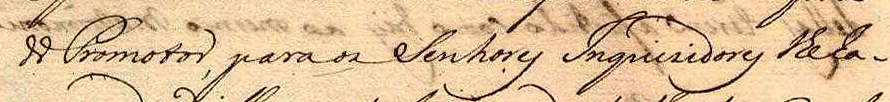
do Promotor, para os Senhores Inquizidores lhe ha
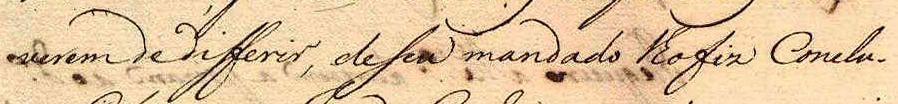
verem de differir, de seu mandado lhe fiz Conclu
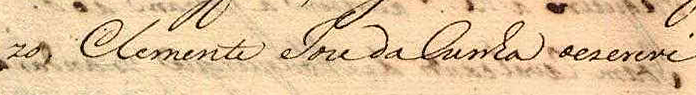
zo Clemente Ioze da Cunha o escrevi
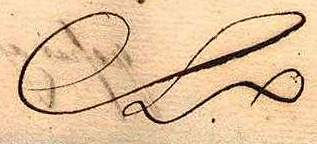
CL.o
